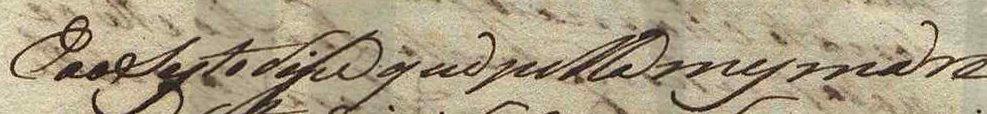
E ao Sesto disse que pella mesma re
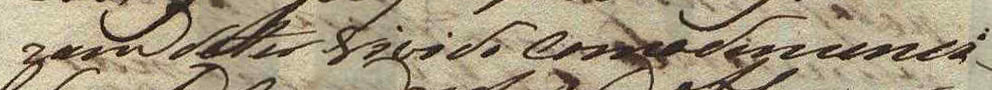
zam de ter vivido com o denuncia
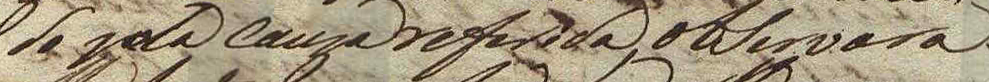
do pela cauza referida, obServara
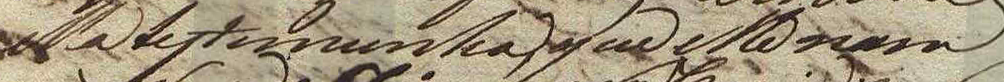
ella testemunha, que elle nam
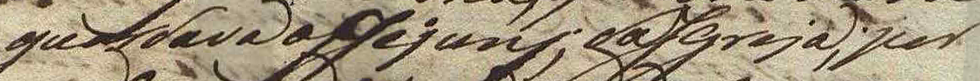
guardava os Jejuns da Jgreja; por
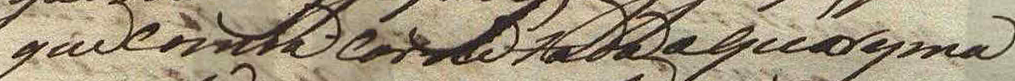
que comia carne toda a quaresma
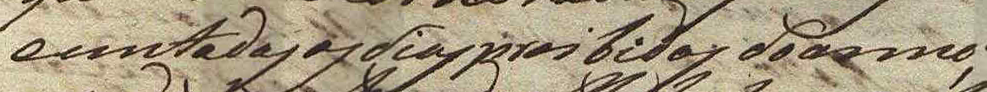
e em todos os dias proibidos do anno;
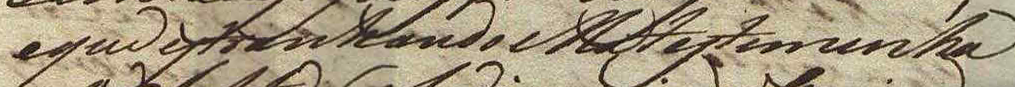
e que estranhando ella testemunha
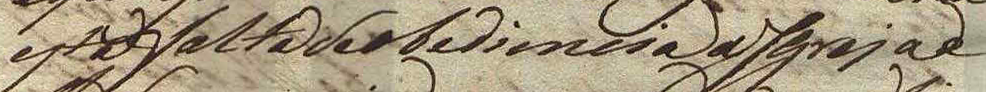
esta falta de obediencia a Jgreja e
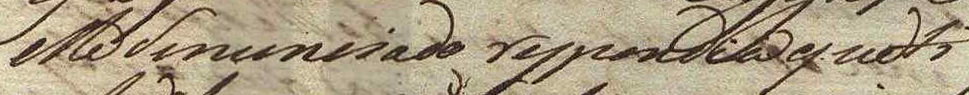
elle denunciado respondia que ti
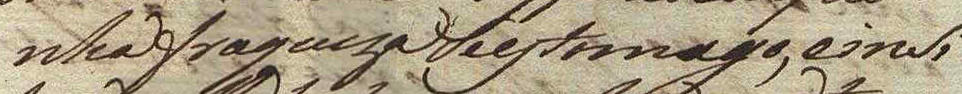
nha fraqueza de estomago, e inSi
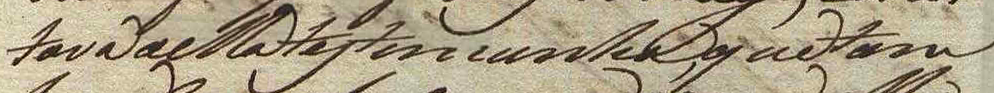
tava a ella testemunha, que tam
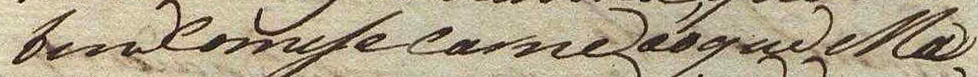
bem comese carne ao que ella
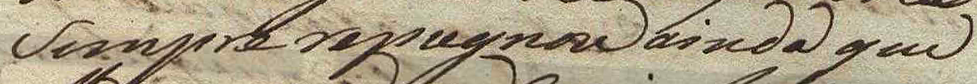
sempre repugnou ainda que
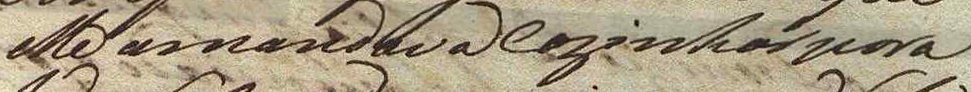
elle a mandava cozinhar para
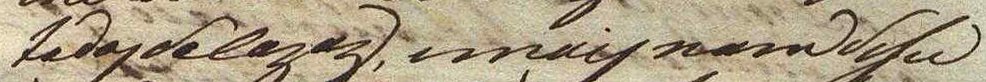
todos de cazaz, e mais nam disse
